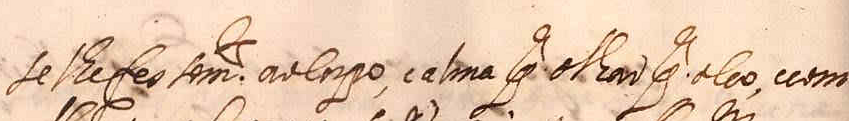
se lhe fes som.te ao Corpo, e alma pa olhar p.a o Ceo, e com
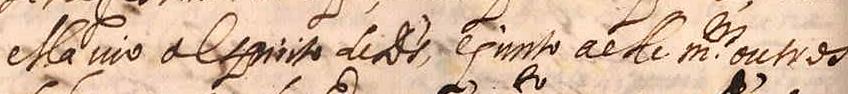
ella uio o Espirito de Ds̄, e junto a elle m.tos outros
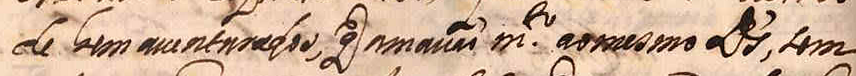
de bem auenturados, q̄ amauaõ m.to ao mesmo Ds̄, sem
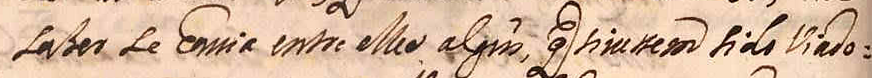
saber se hauia entre elles algūs, q̄ tiuessem tido Viado
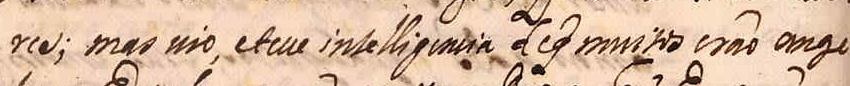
res; mas uio, e teue intelligencia de q̄ muitos erão ange
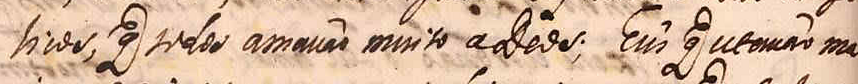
licos, q̄ todos amauão muito a Deos; hus̄ q̄ estauaõ ma
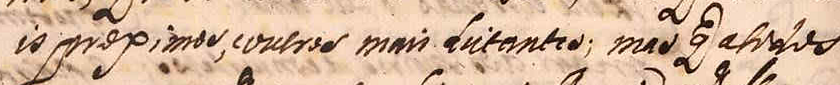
is proximos, e outros mais distantes; mas q̄ a todos
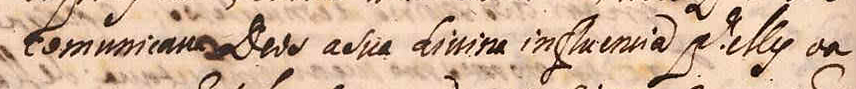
comunicaua Deos a sua diuina influencia p.a elles o a
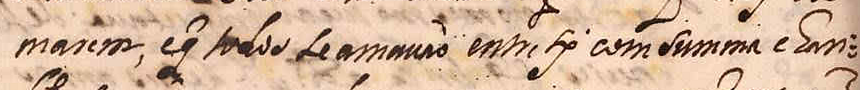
marem, e q̄ todos se amauão entre sy com summa chari
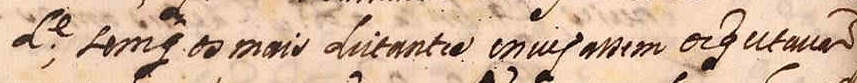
d.e, sem q̄ os mais distantes enuejassem os q̄ estauaõ
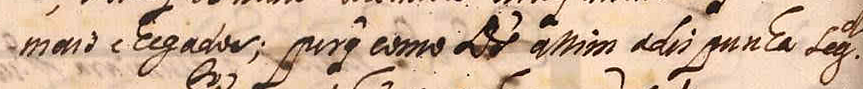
mais chegados; porq̄ como Ds̄ assim o dispunha segdo.
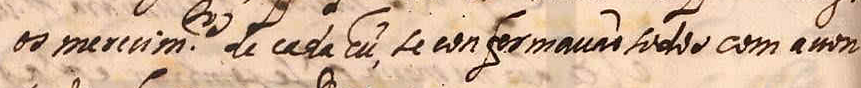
os merecim.tos de cada hū, se conformauaõ todos com a uon
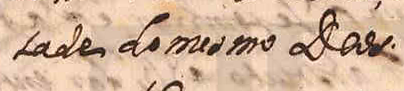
tade do mesmo Deos.
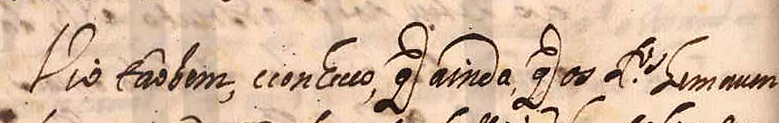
Vio taõbem, e conheceo, q̄ ainda q̄ os d̄.os bem auen
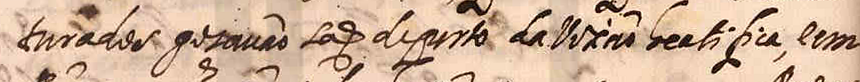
turados gozauão taõ de perto da vizaõ beatifica, e em
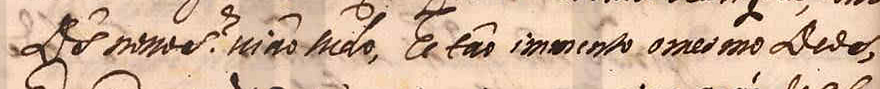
Ds̄ nosso s.or uiaõ tudo, he tão immenso o mesmo Deos,
